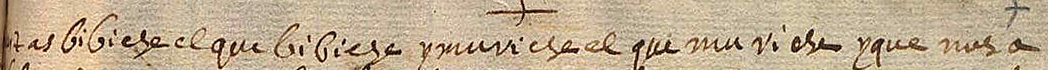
tas bibiese el que bibiese y muriese el que muriese y que nos a
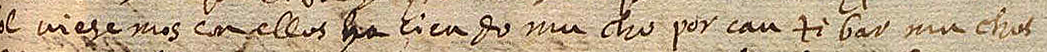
bol uiesemos con ellos haciendo mucho por cautibar muchos
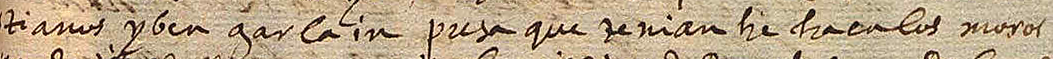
tianos y bengar la inpresa que tenian hecha ca los moros
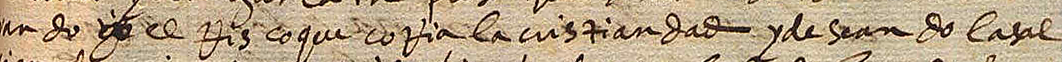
irando yo el Risco que coRia la cristiandad e deseando la sal
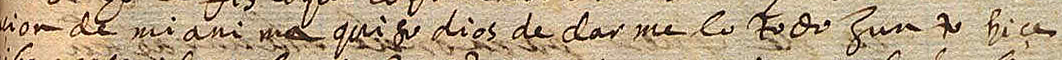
cion de mi anima quiso dios de dar me lo todo Junto hice
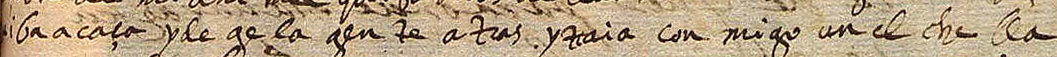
iba a caça y dege la gente atras y traia conmigo un elche lla
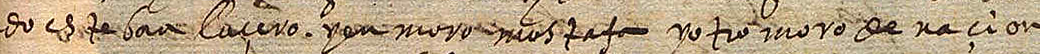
ado esteban lucero y en moro mustafa y otro moro de naçion
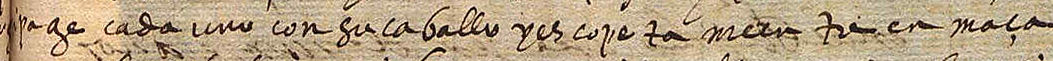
ipage cada uno con su caballo y escopeta me entre en maça
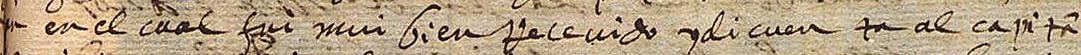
an en el cual fui mui bien Receuido y di cuenta al capitā
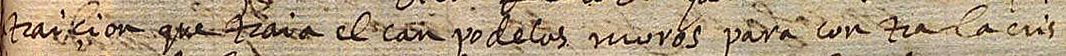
traicion que traia el canpo de los moros para contra la cris
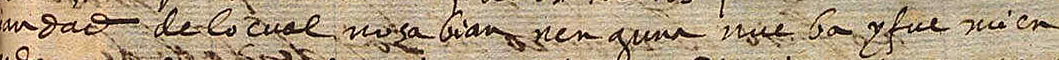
andad de lo cual no sabian nenguna nueba y fue mi en
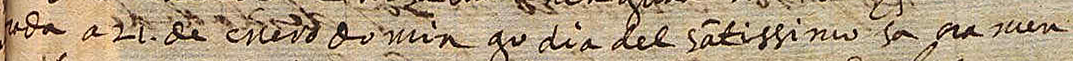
ada a 21. de enero domingo dia del sātissimo sacramen
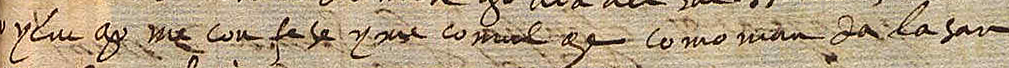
y luego me confese y me comulge como manda la san
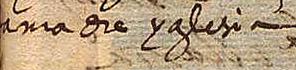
a madre yglesia
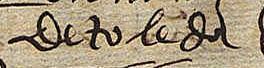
de toledo
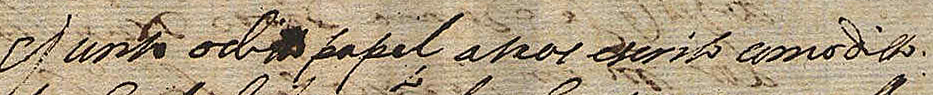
E junto o ditto papel atras escrito como ditto
